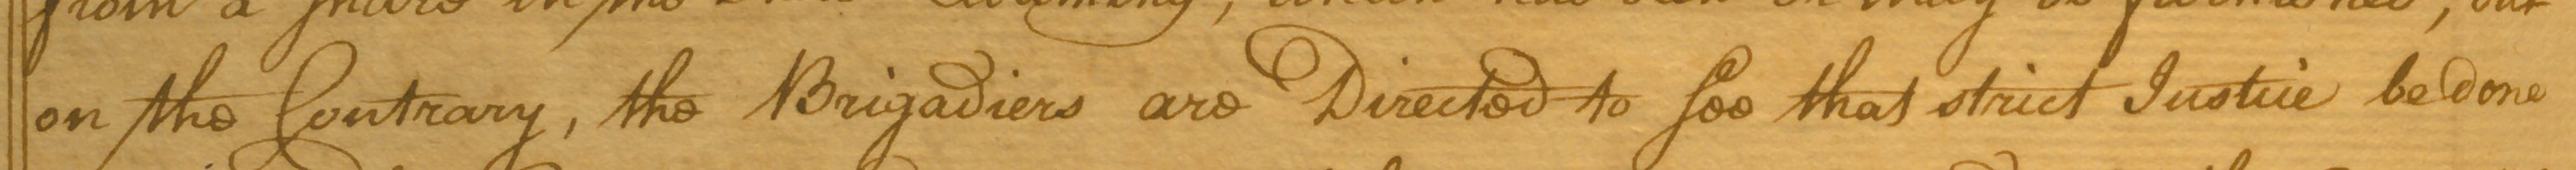on the Contrary, the Brigadiers are Directed to see that strict Justice be done
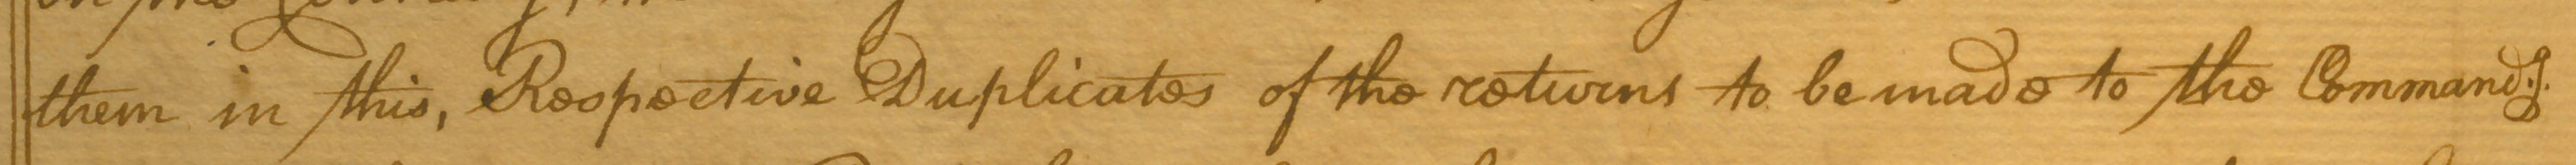them in this, Respective Duplicates of the returns to be made to the Command^g.
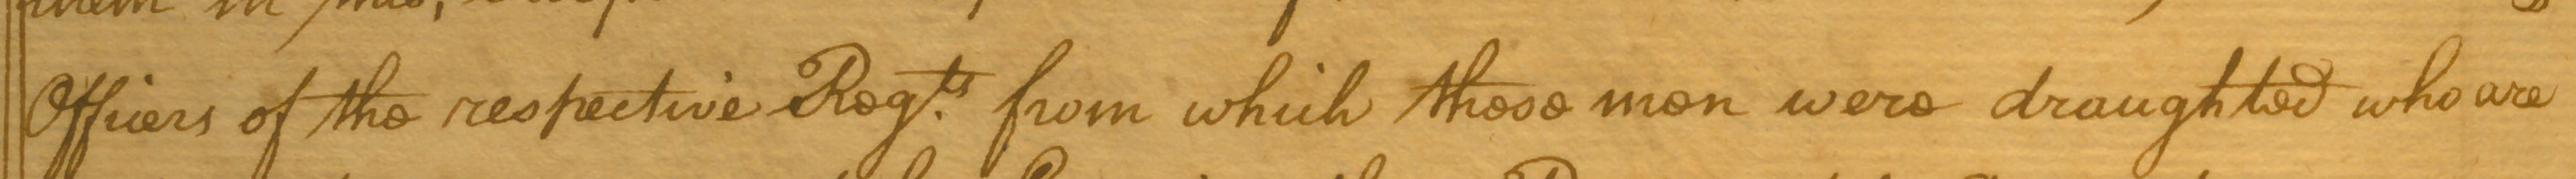Officers of the respective Reg^ts. from which these men were draughted who are
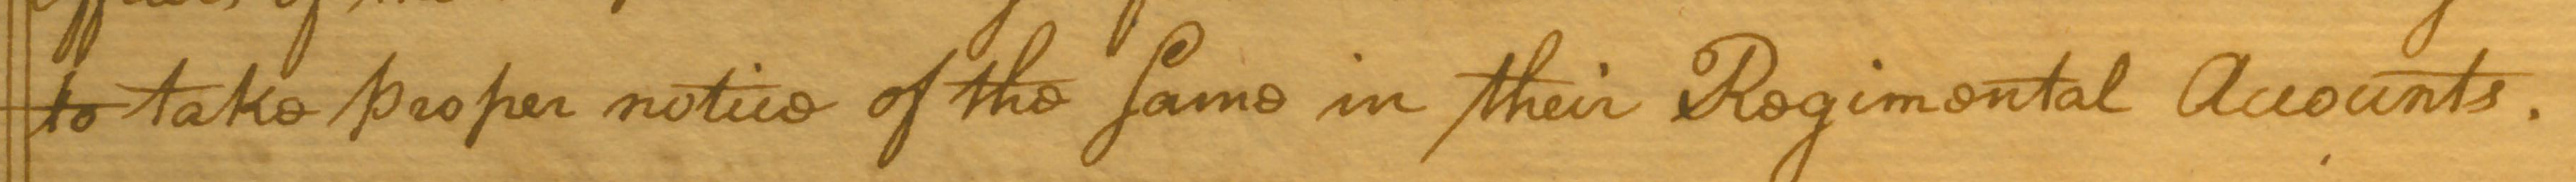to take proper notice of the same in their Regimental Accounts.
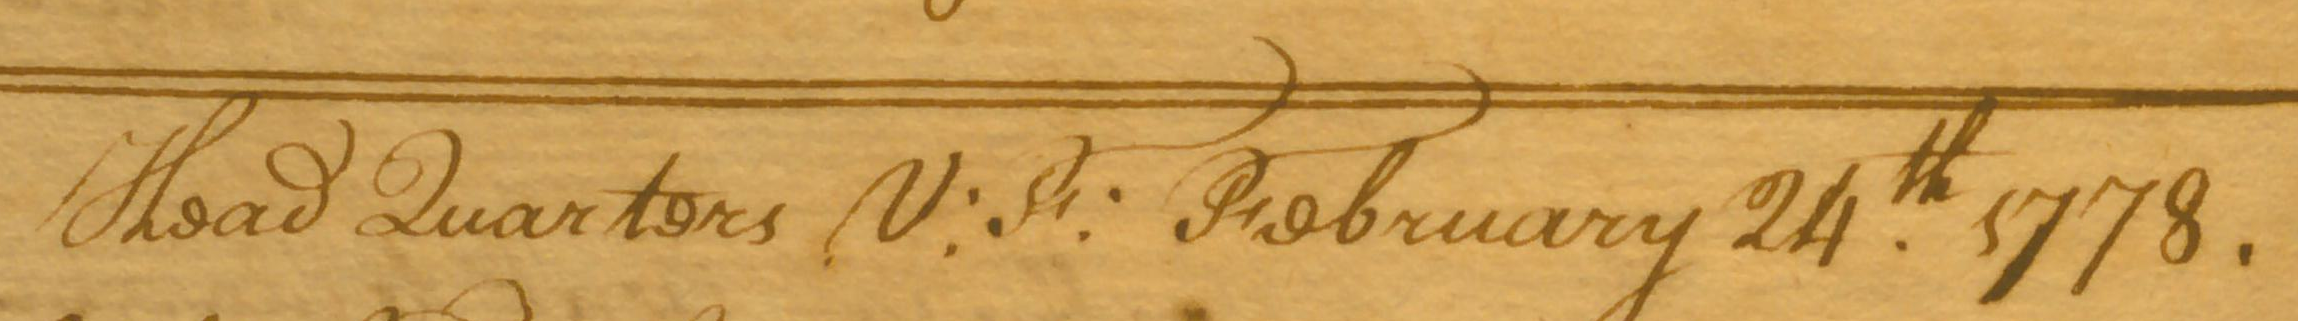Head Quarters V: F: February 24^th. 1778.
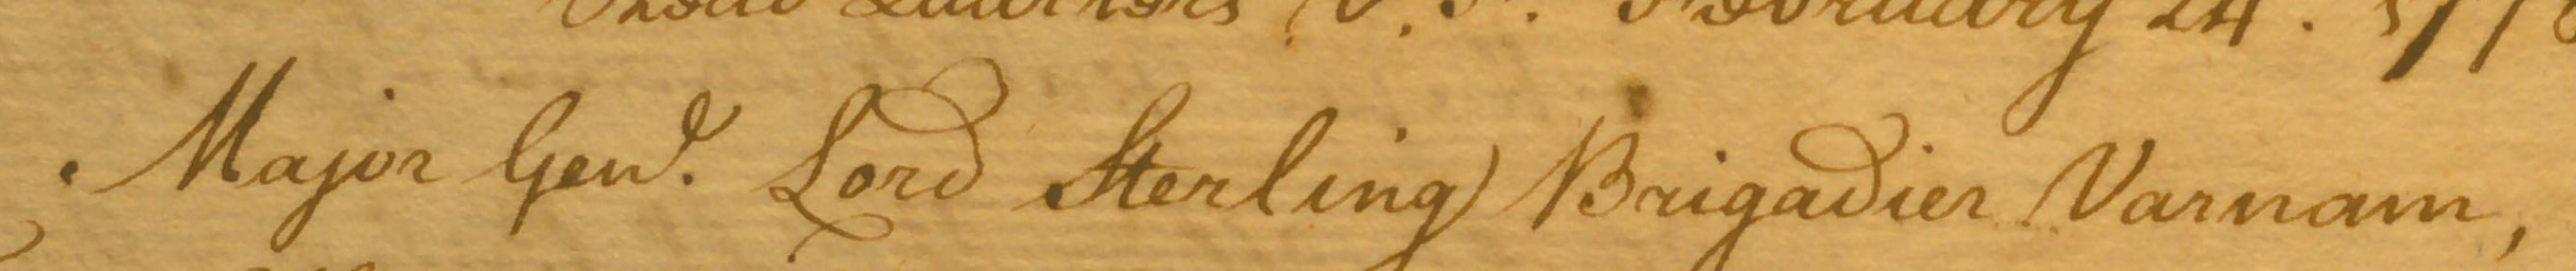Major Gen^l. Lord Sterling Brigadier Varnam,
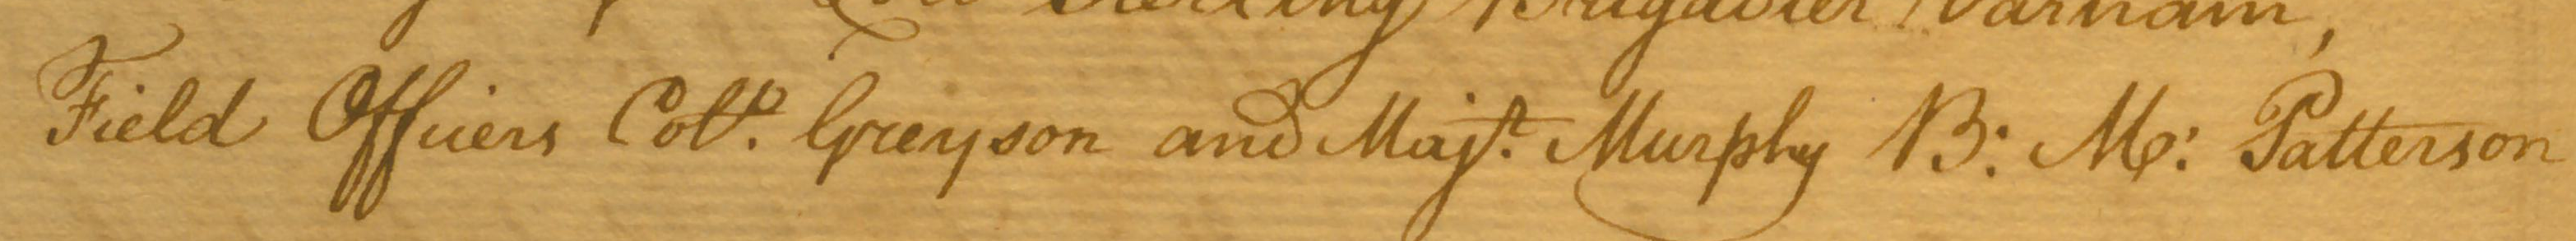Field Officers Col^o. Greyson and Maj^r. Murphy B: M: Patterson
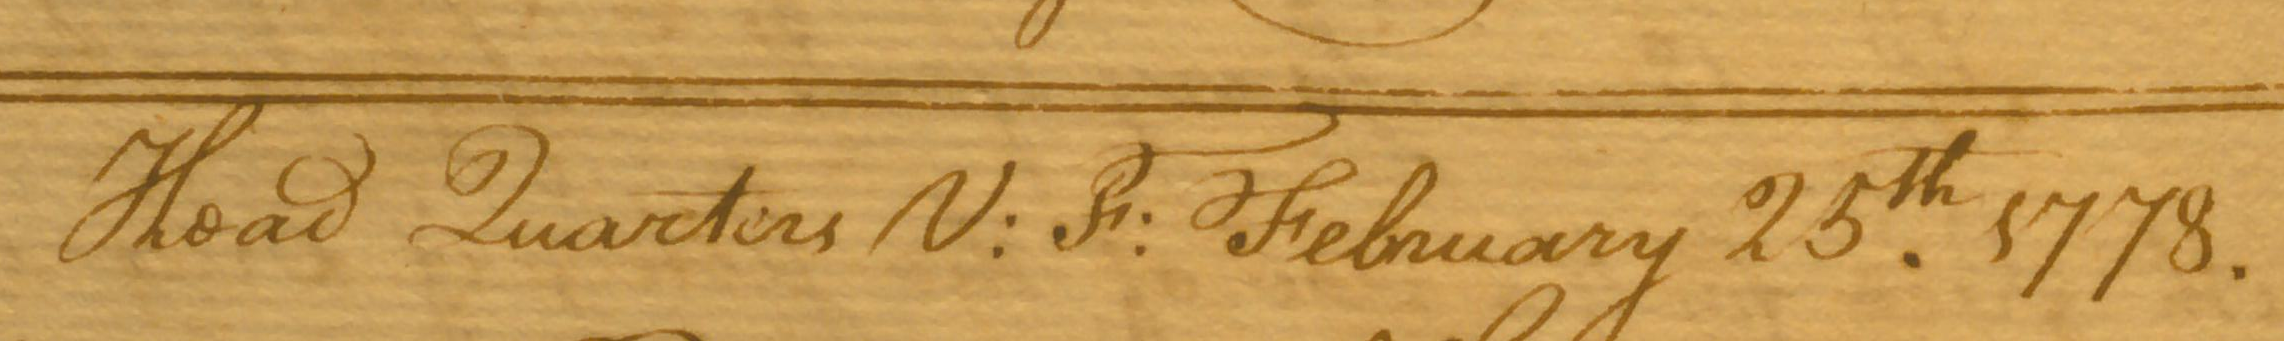Head Quarters V: F: February 25^th. 1778.
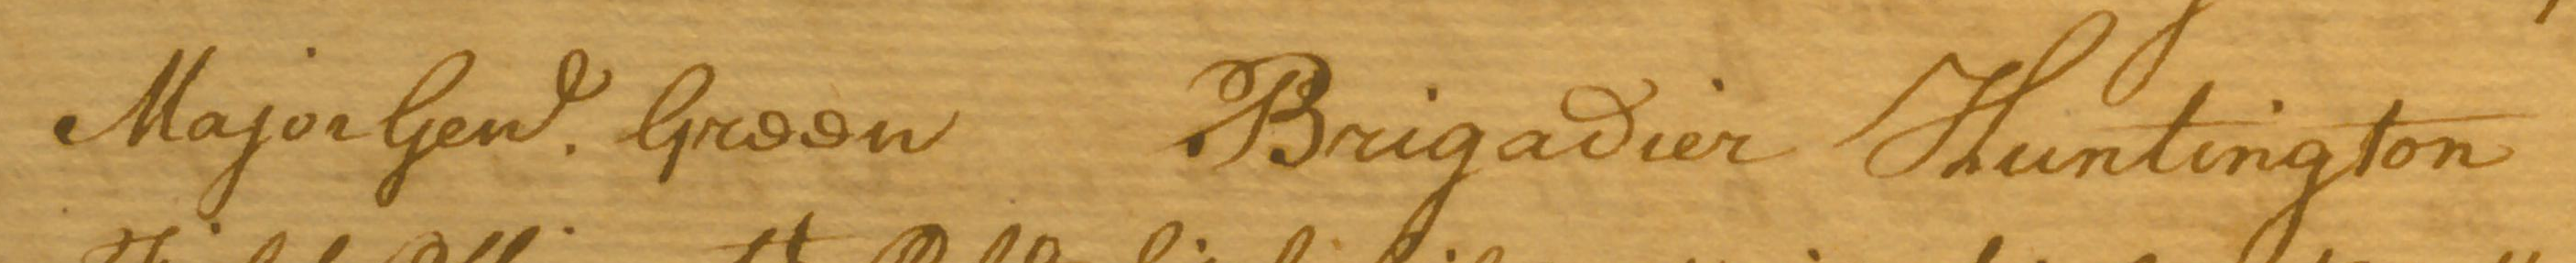Major Gen^l. Green Brigadier Huntington
